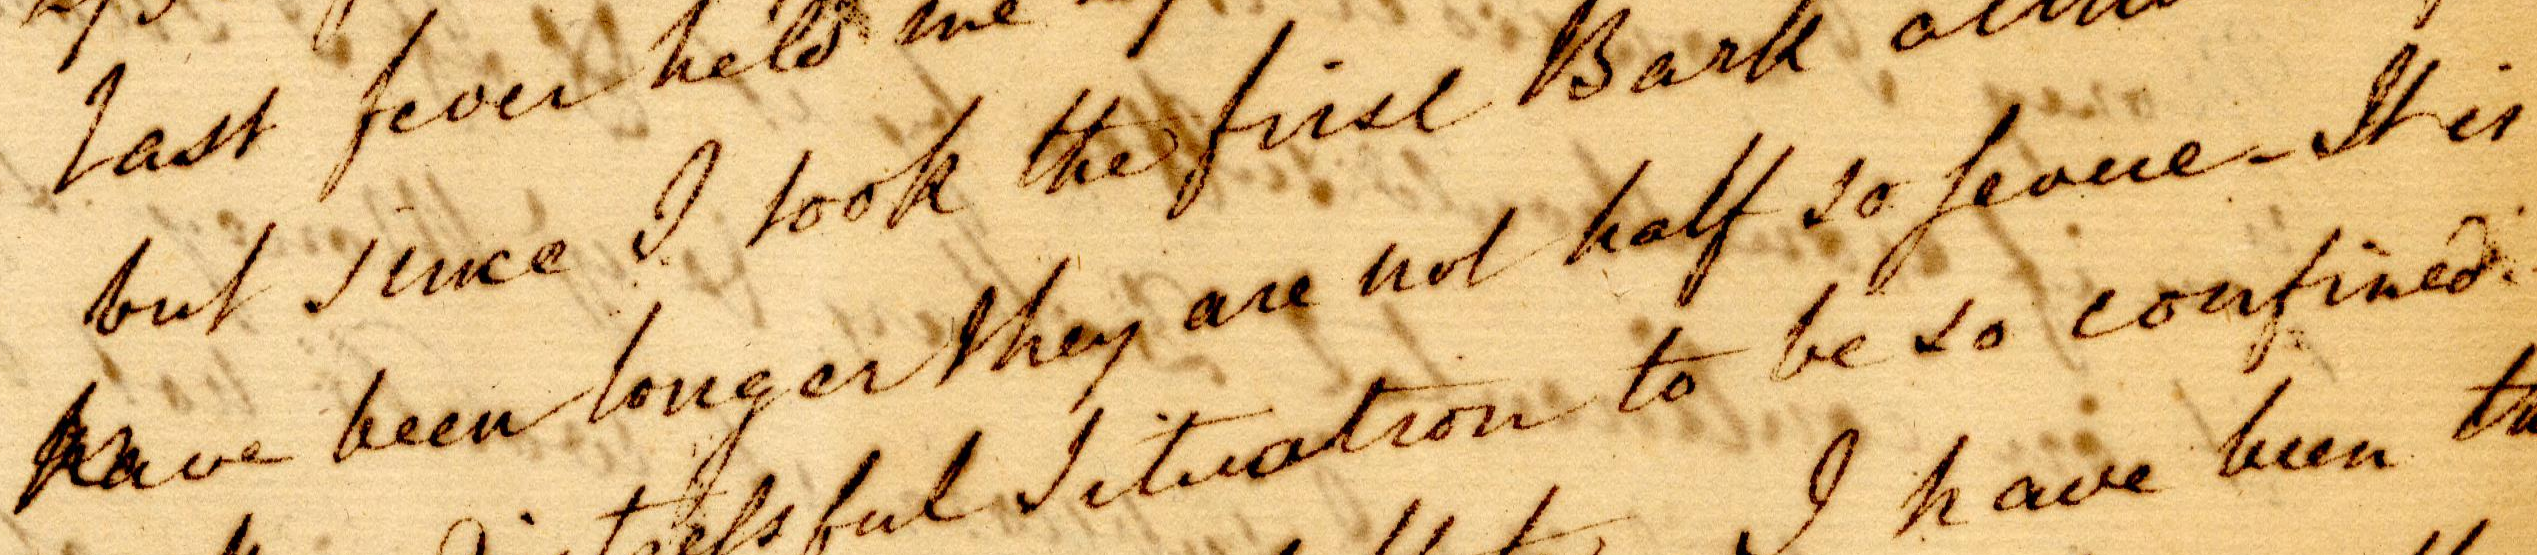have been longer they are not half so severe- It is
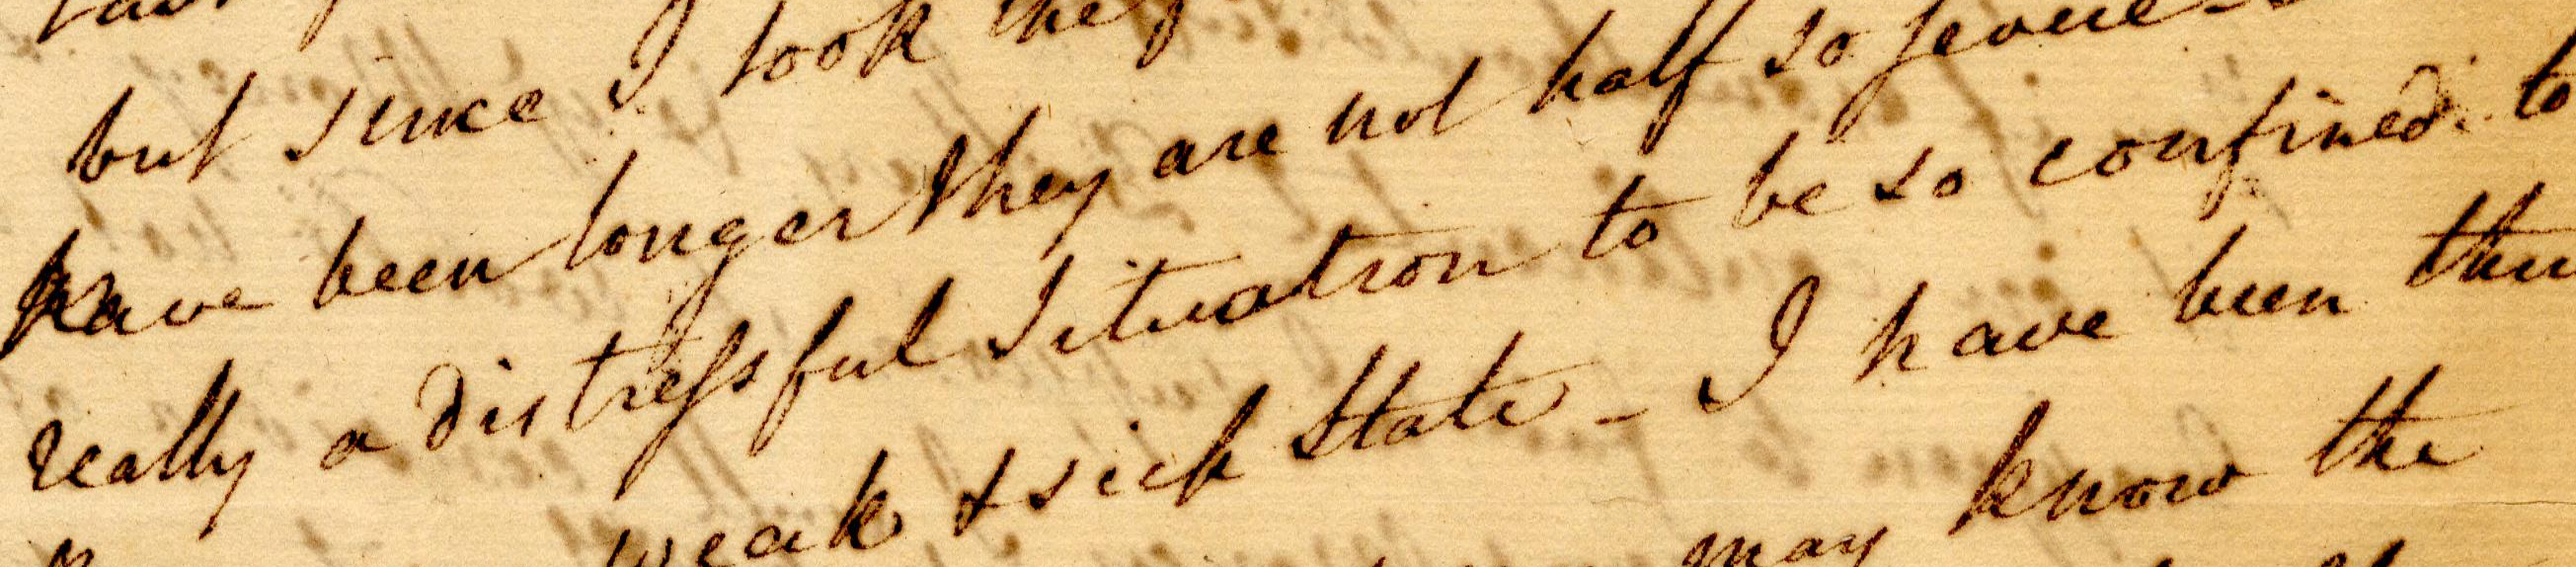really a distressful Situation to be so confined to
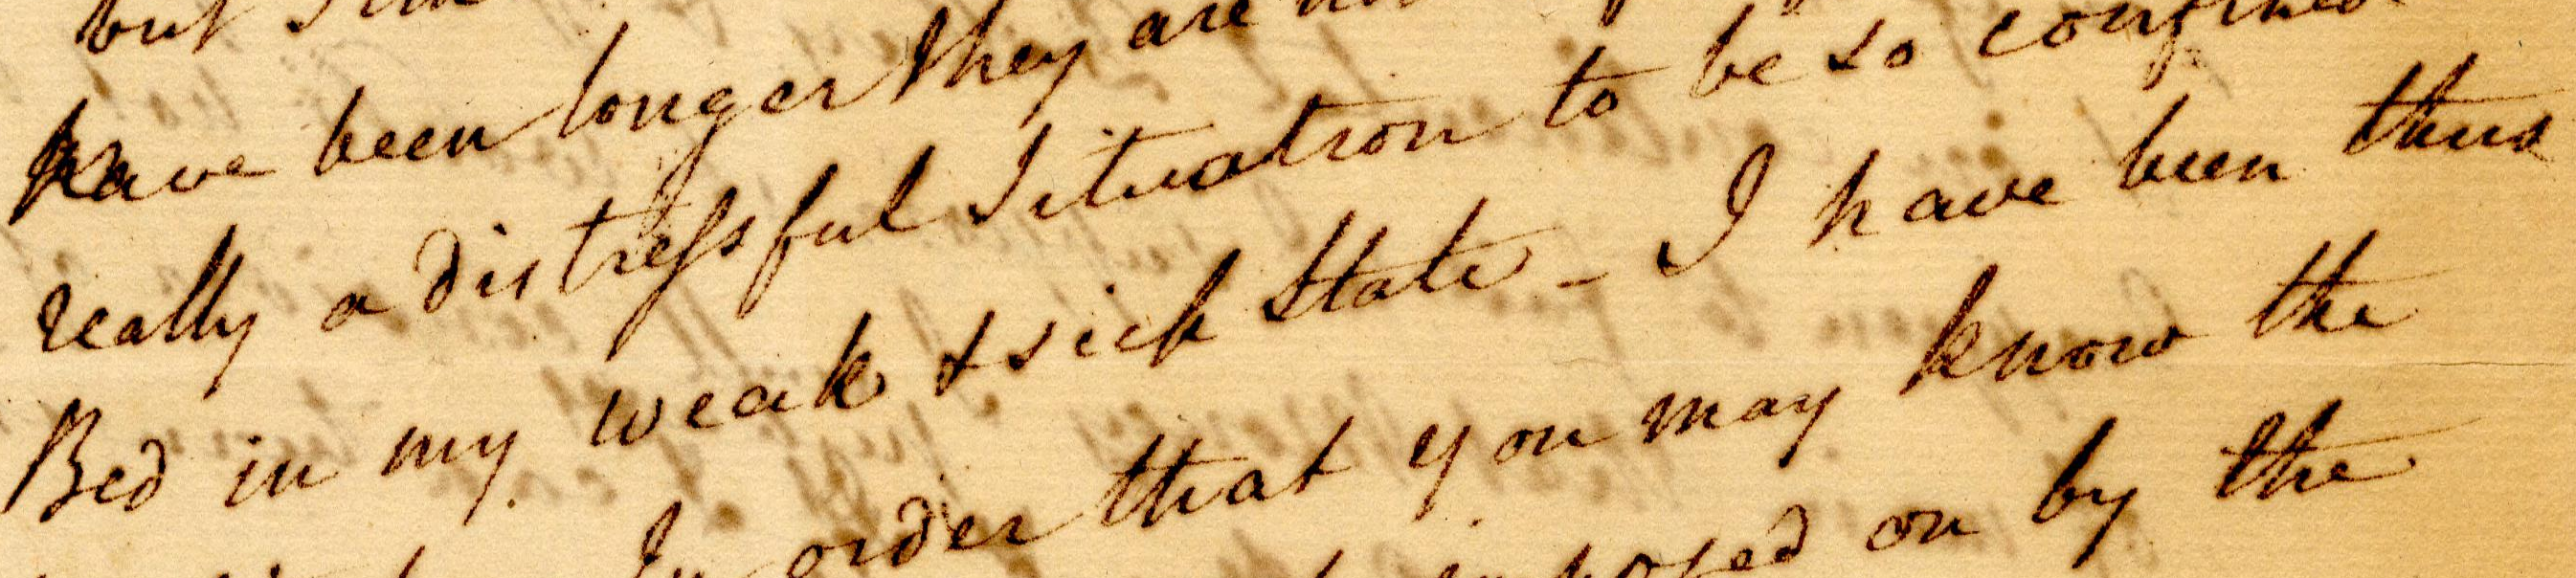Bed in my weak & sick State- I have been thus
